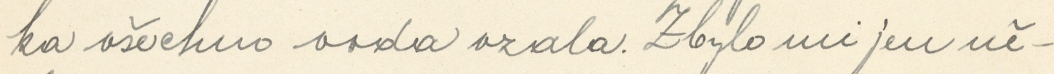ka všechno voda vzala. Zbylo mi jen ně-
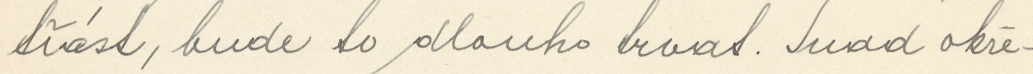třást, bude to dlouho trvat. Snad okře-
